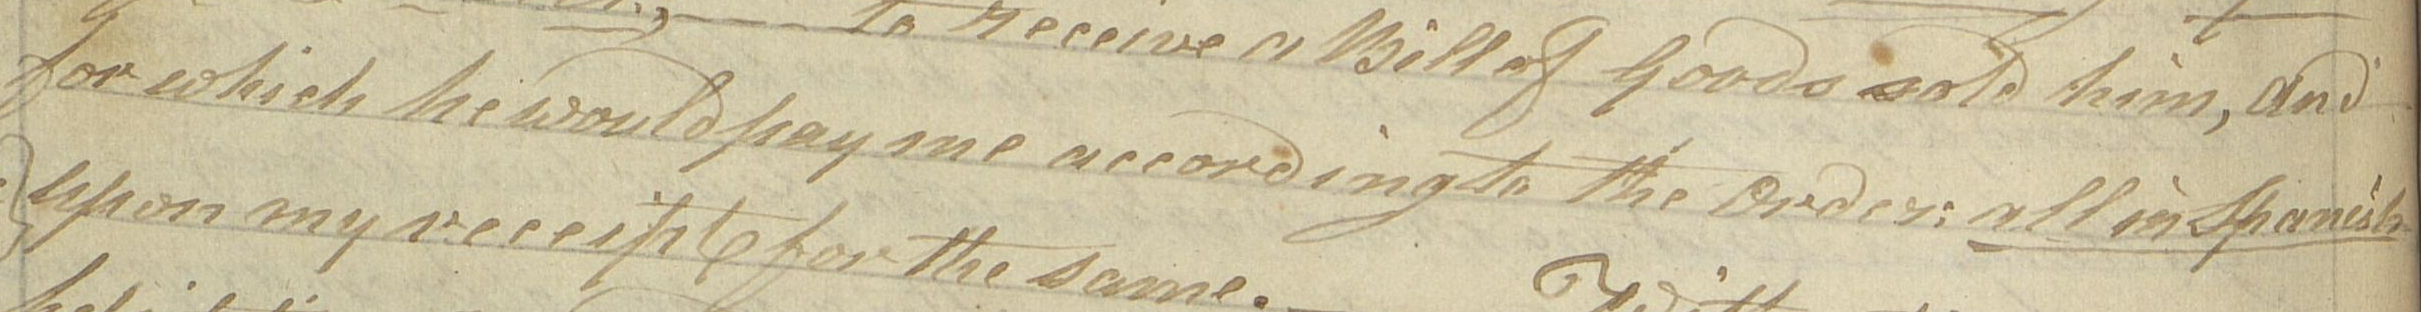for which he would pay me according to the order: all in Spanish
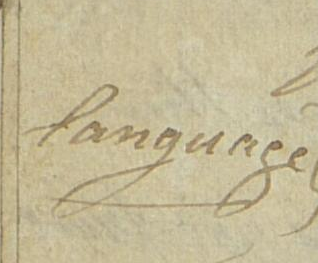language
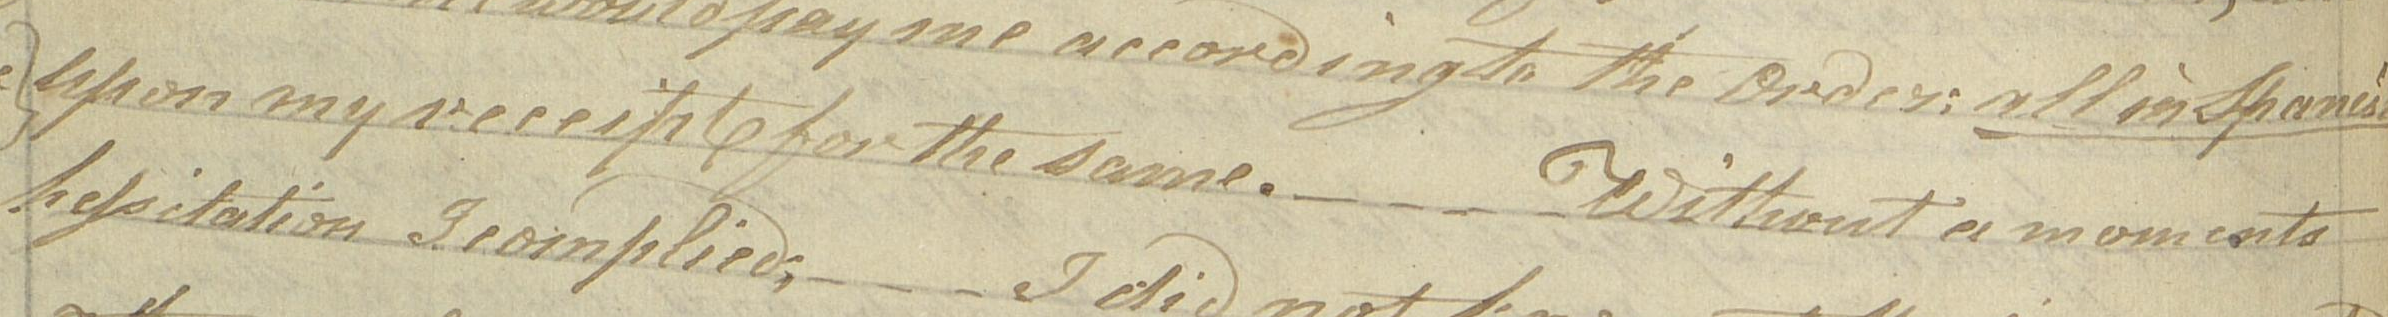upon my receipt for the same. Without a moments
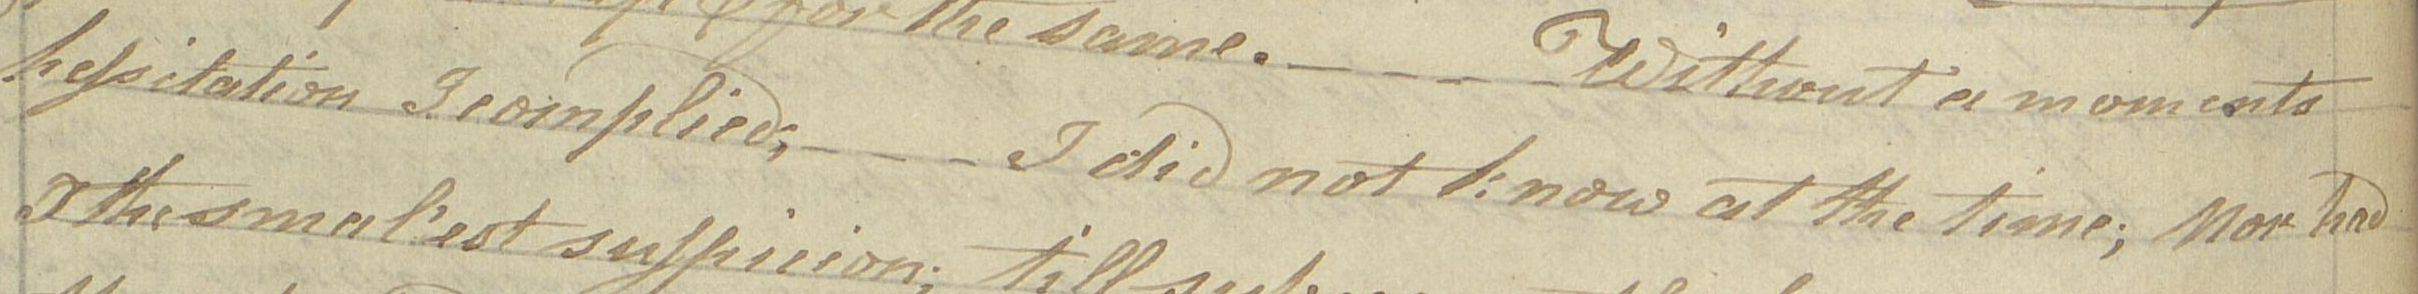hesitation I complied; I did not know at the time; Nor had
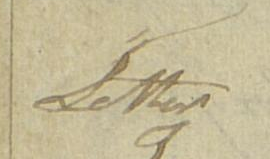Letter
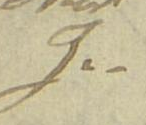J
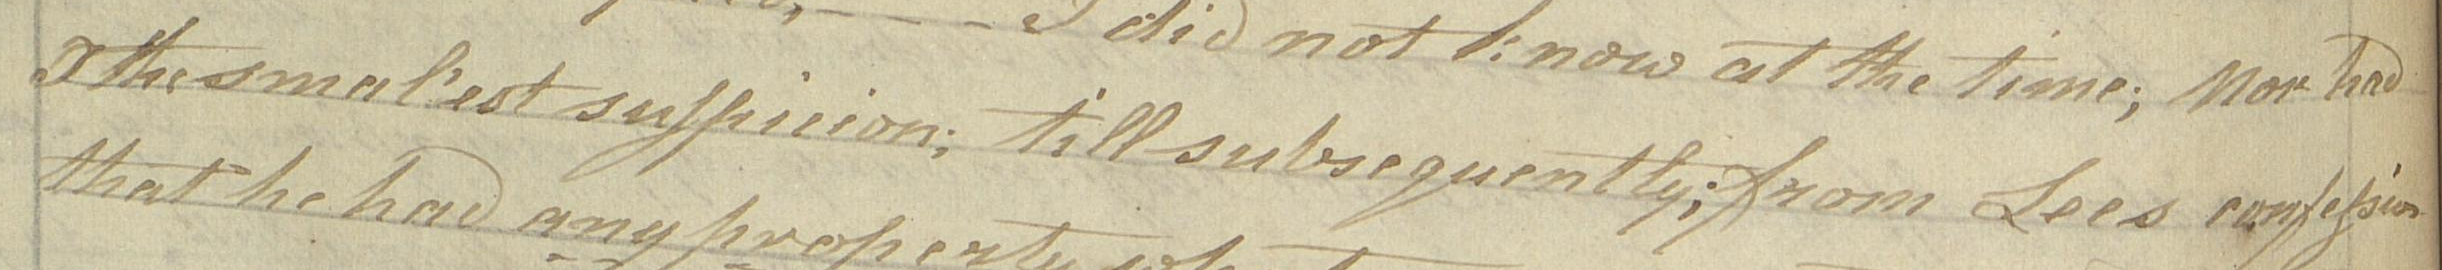the smallest suspicion; till subsequently; from Lees confession
